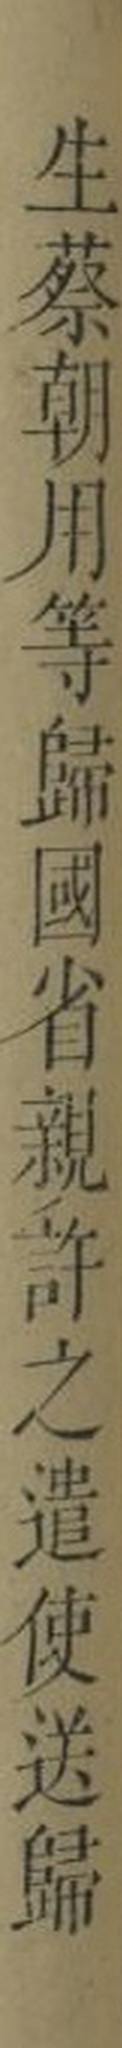生蔡朝用等帰国省親許之遣使送帰
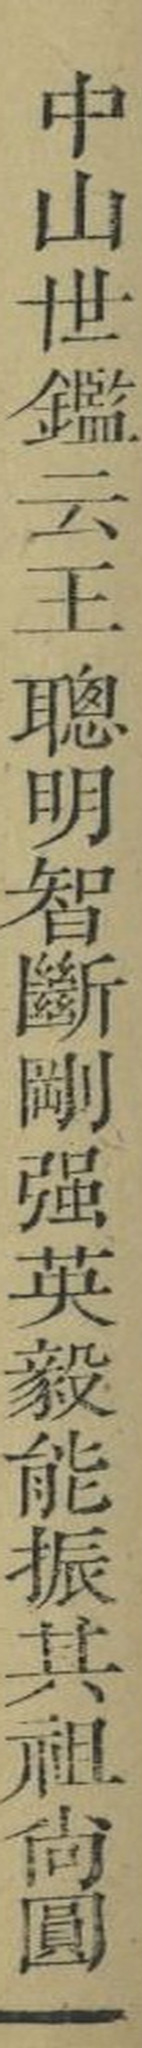中山世鑑云王聡明智断剛強英毅能振其祖尚円
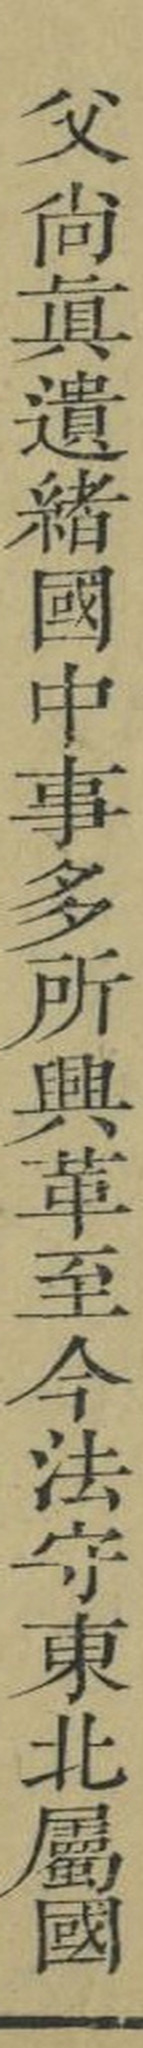父尚真遺緒国中事多所興革至今法守東北属国
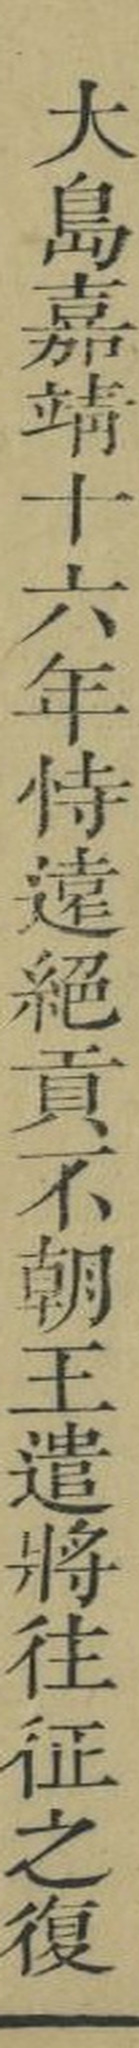大島嘉靖十六年恃遠絶貢不朝王遣将往征之復
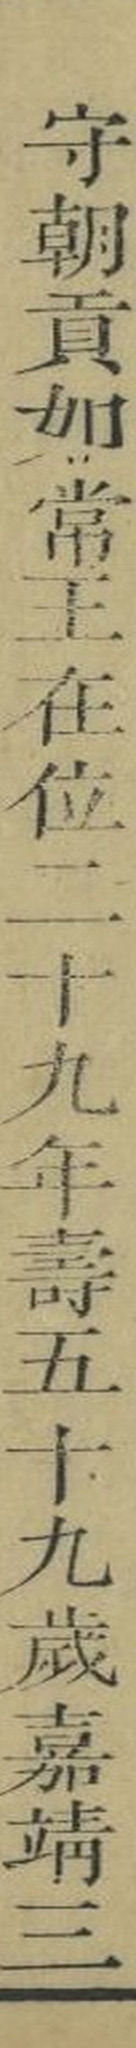守朝貢如常王在位二十九年寿五十九歳嘉靖三
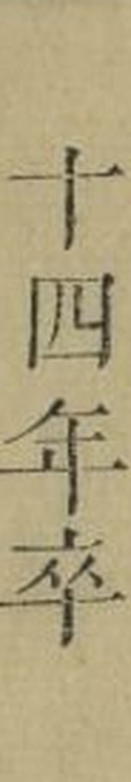十四年卒
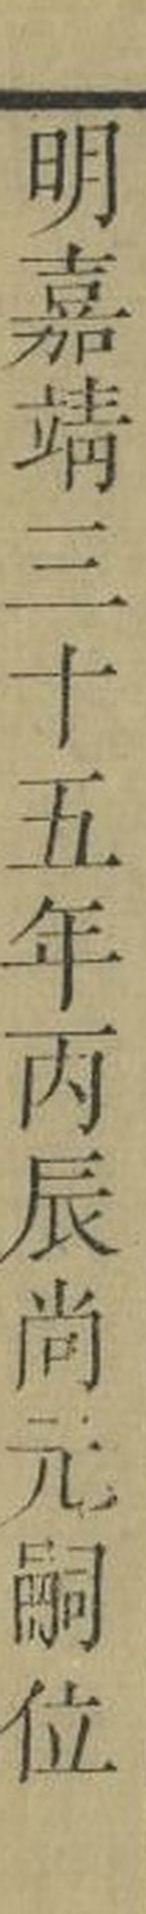明嘉靖三十五年丙辰尚元嗣位
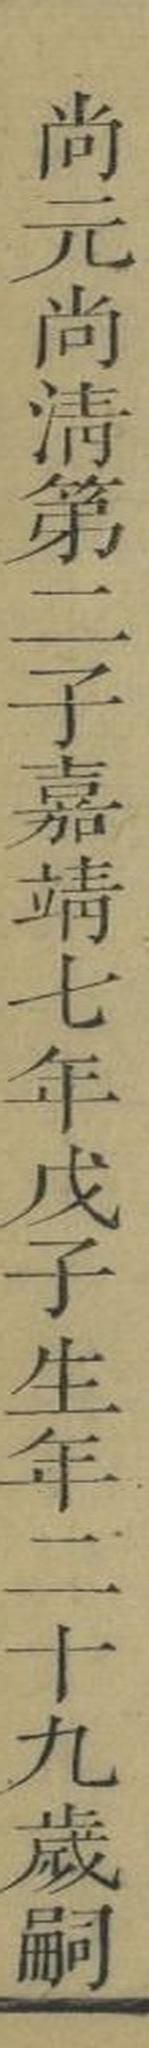尚元尚清第二子嘉靖七年戌子生年二十九歳嗣

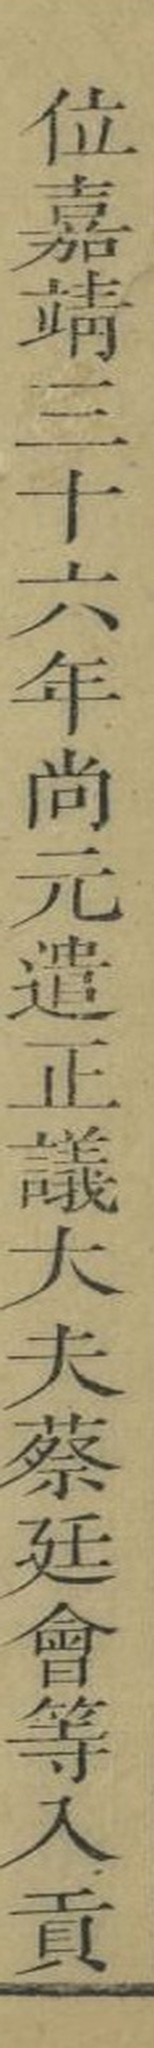位嘉靖三十六年尚元遣正議大夫蔡廷会等入貢
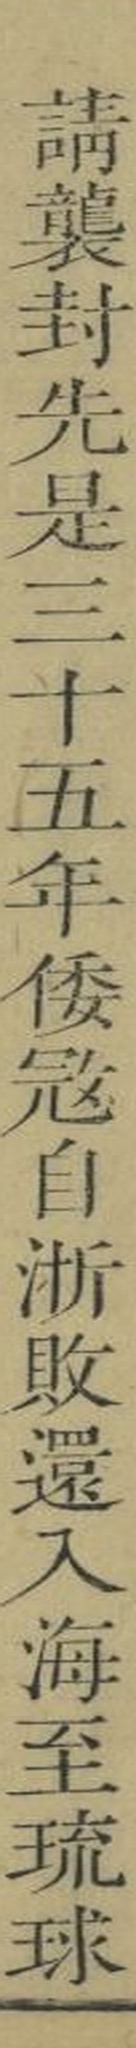請襲封先是三十五年倭寇自浙敗還入海至琉球
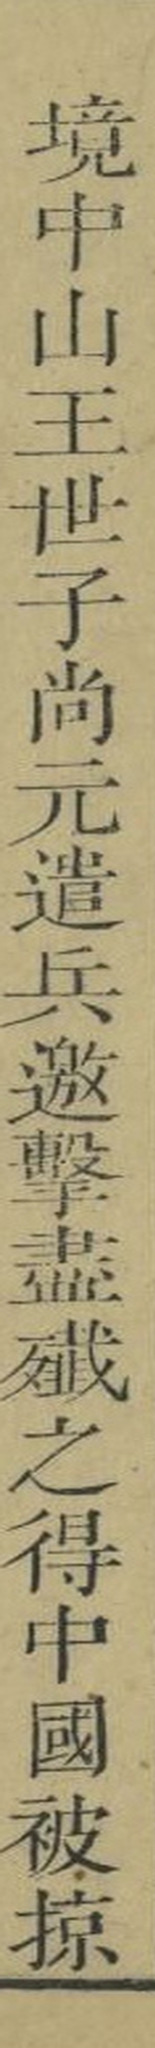境中山王世子尚元遣兵邀撃尽殲之得中国被掠
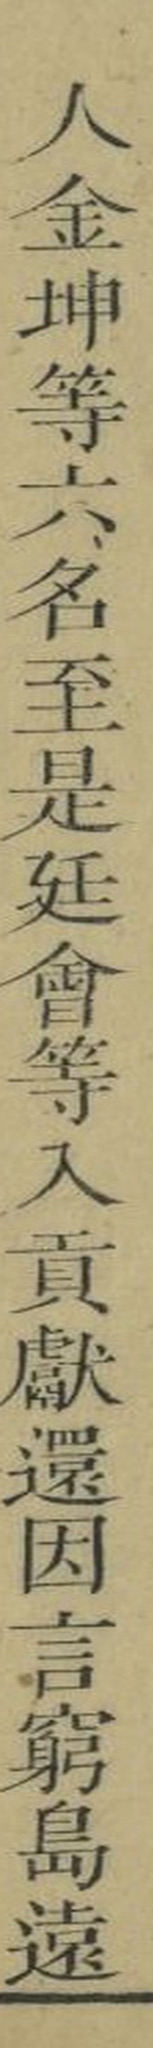人金坤等六名至是廷会等入貢献還因言窮島遠
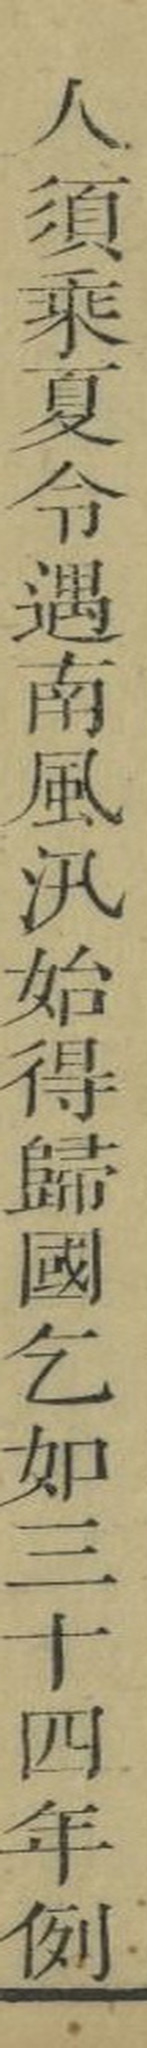人須乗夏令遇南風汛始得帰国乞如三十四年例
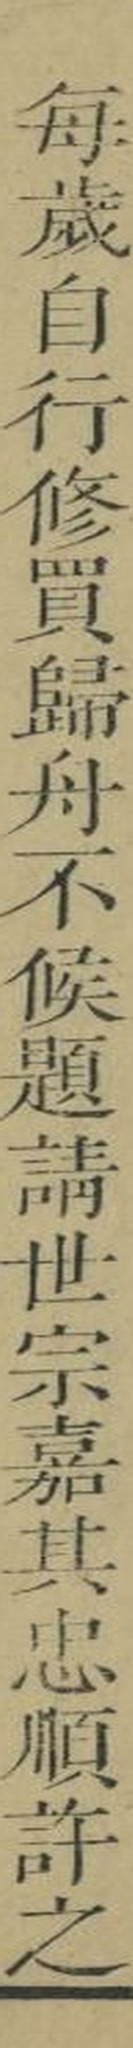毎歳自行修買帰舟不候題請世宗嘉其忠順許之
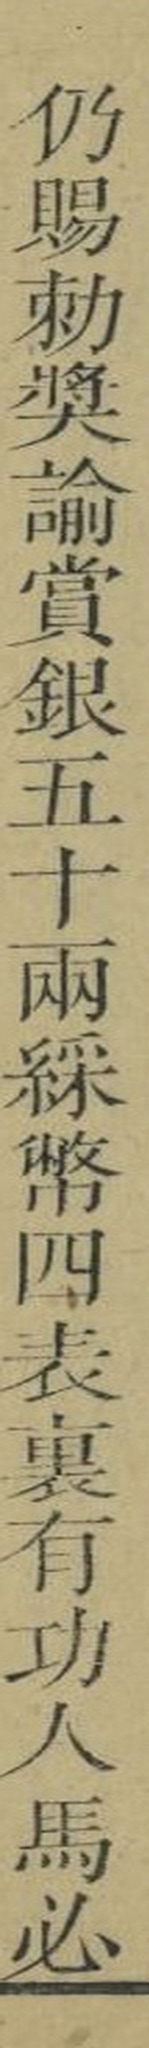仍賜勅奨諭賞銀五十両綵幣四表裏有功人馬必
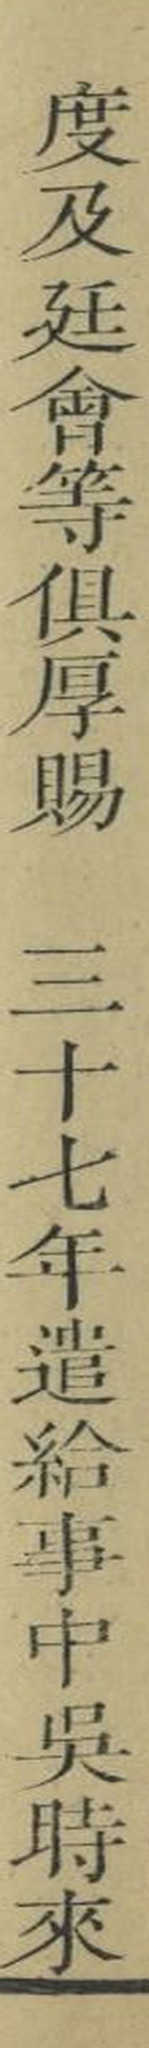度及廷会等俱厚賜三十七年遣給事中呉時来
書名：中山伝信録 巻三
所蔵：University of the Ryukyus Library
